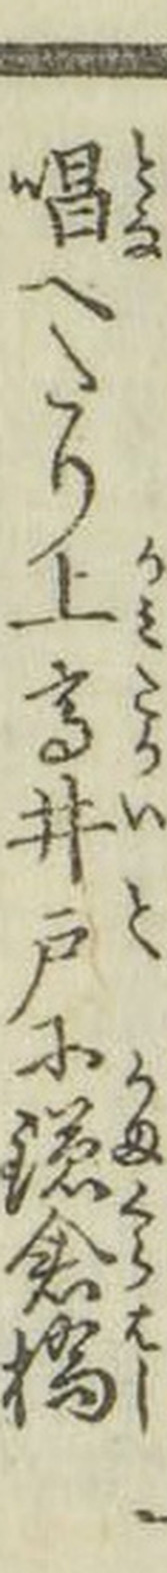唱へたり上高井戸に鎌倉橋
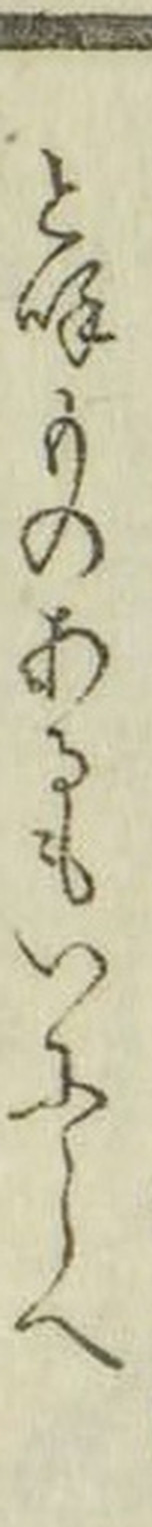と呼ものあるもいにしへ
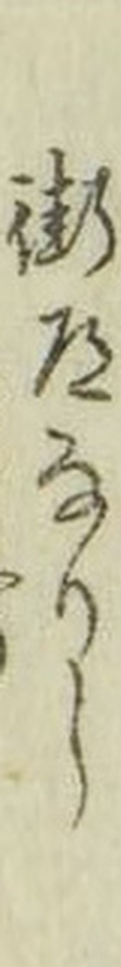街道なりし
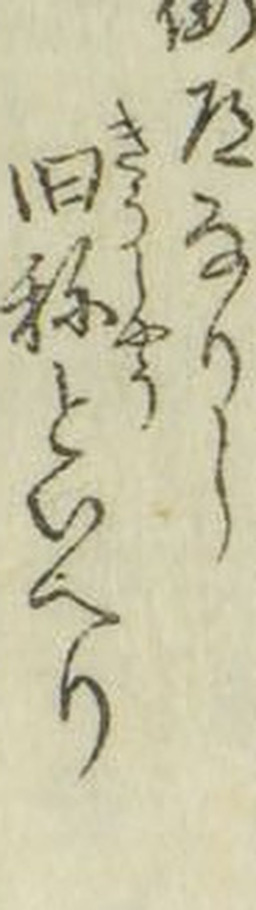旧称といへり

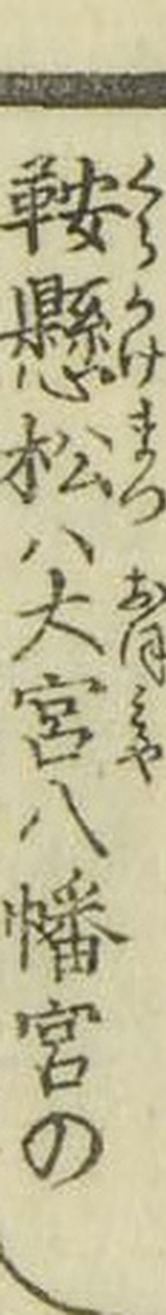鞍懸松は大宮八幡宮の
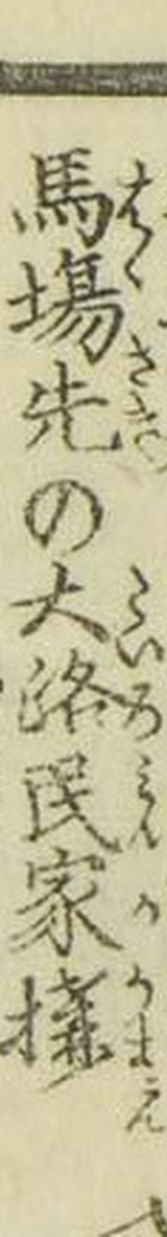馬場先の大路民家構
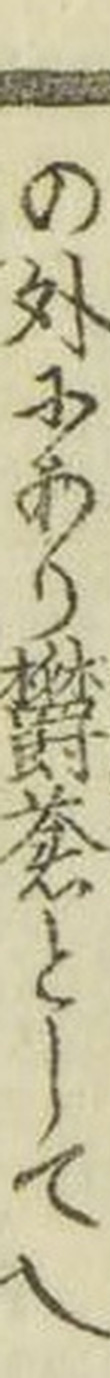の外にあり鬱蒼として
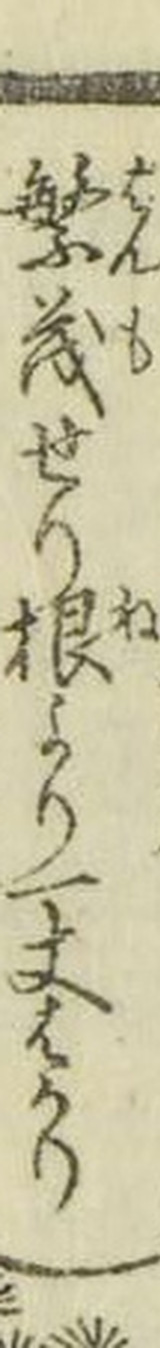繁茂せり根より一丈はかり
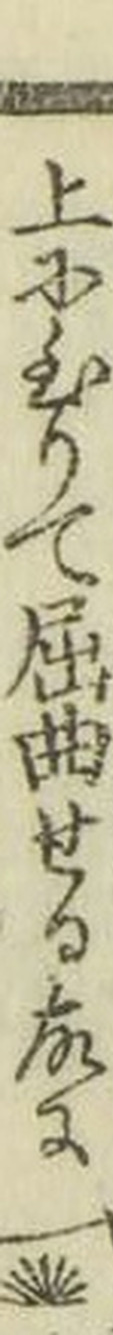上に至りて屈曲せる故に
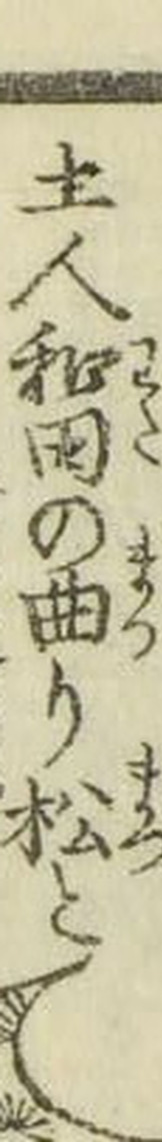土人和田の曲り松と
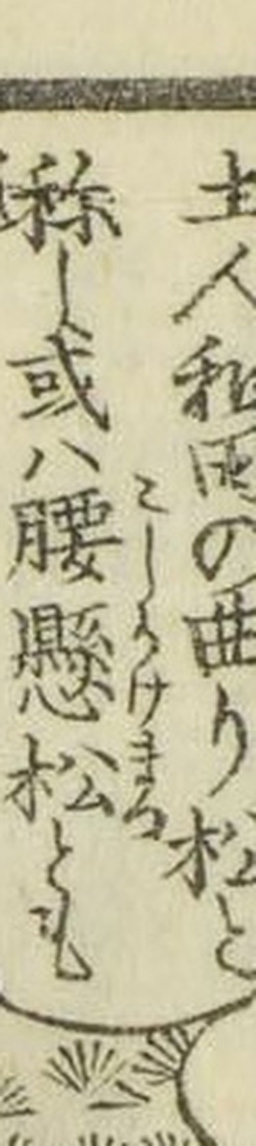称し或は腰懸松とも
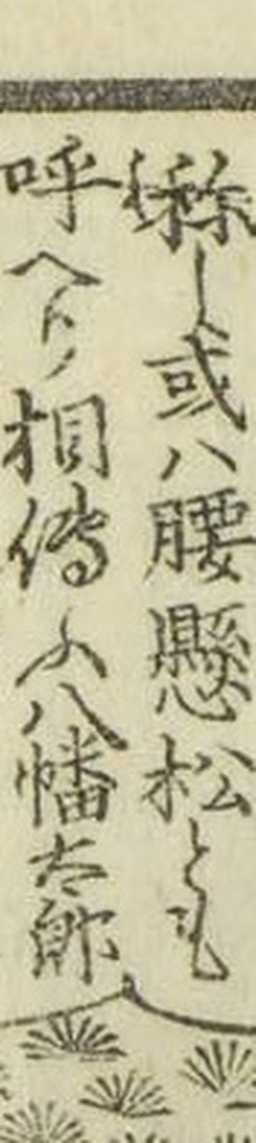呼へり相伝ふ八幡太郎
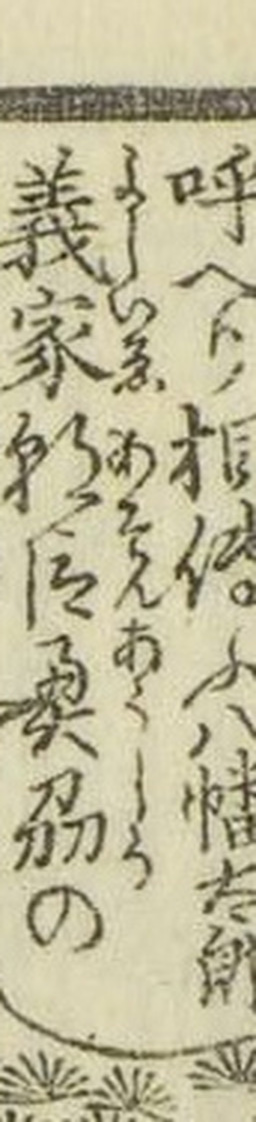義家朝臣奥州の
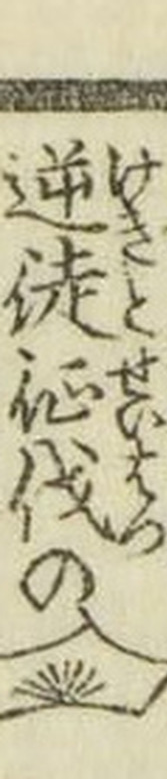逆徒征伐の
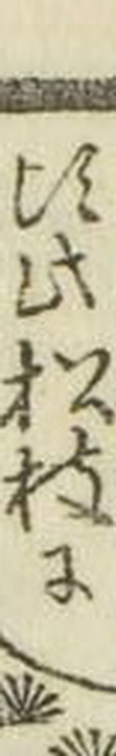頃此松枝に
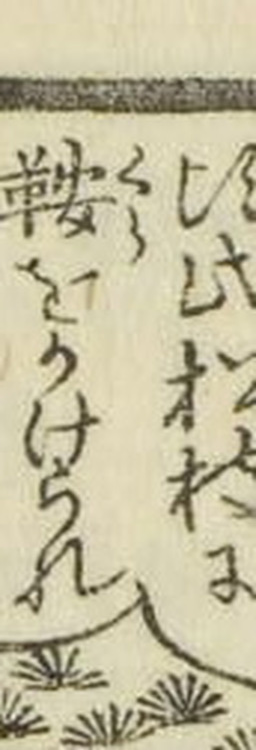鞍をかけられ
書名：江戸名所図会 20巻 巻之11
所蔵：東京学芸大学教育コンテンツアーカイブ
